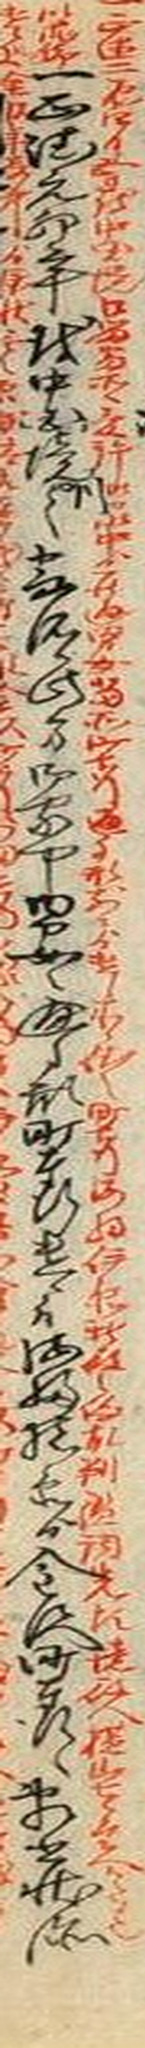一正徳元卯年越中国境川之番所へ此方御家中男女之通手形町奉行遣候ニ付海福猪兵衛ゟ金沢町奉行へ頼書状添
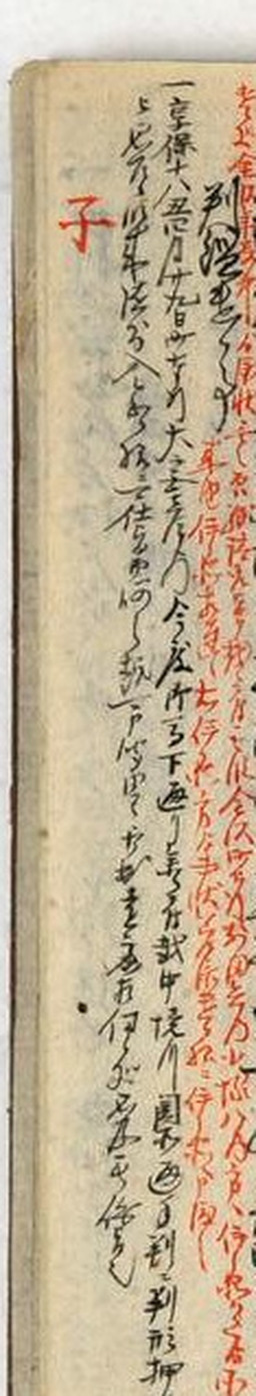被思召候以来随分入念候様ニ可仕旨御呵之趣可申聞由被仰出遠慮相伺候処不及其儀旨也

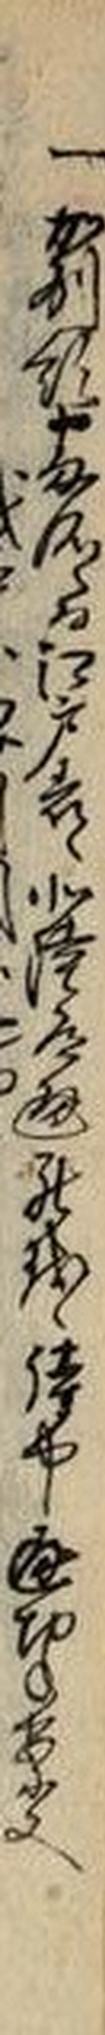一加州領番所へ為江戸表へ北陸道通罷越候侍中通切手案文
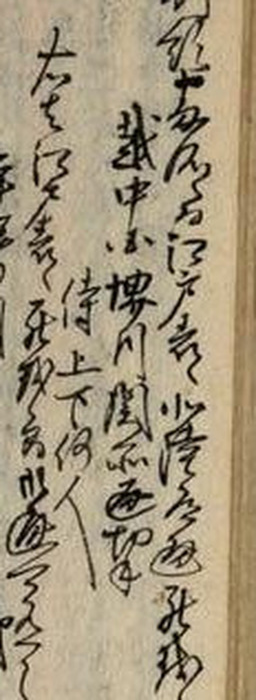越中国堺川関所通切手
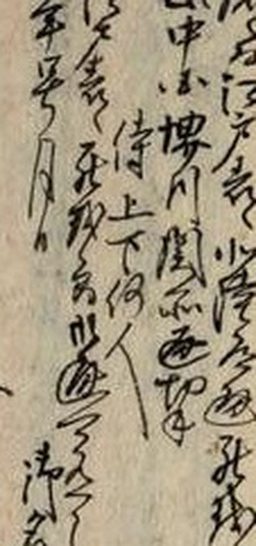侍上下何人
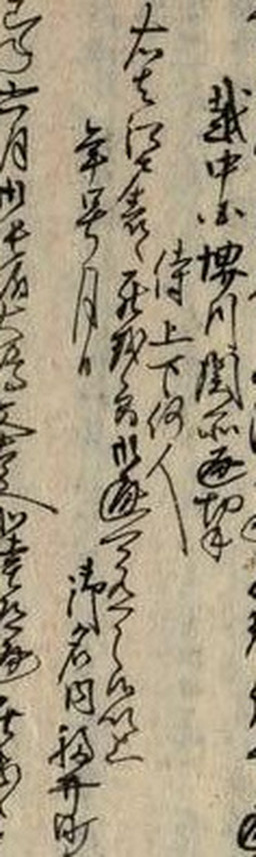右者江戸表へ罷越候為御通可有之候以上
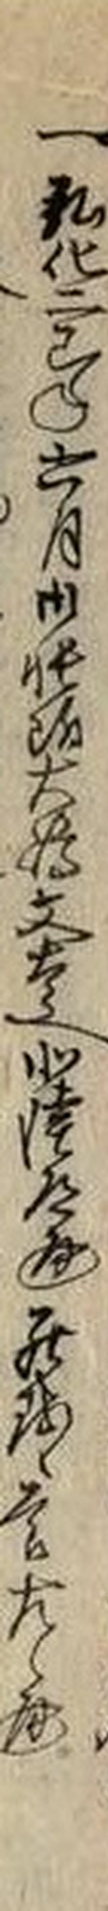一弘化二巳年六月御帳附大嶋文太夫北陸道通罷越候節左之通
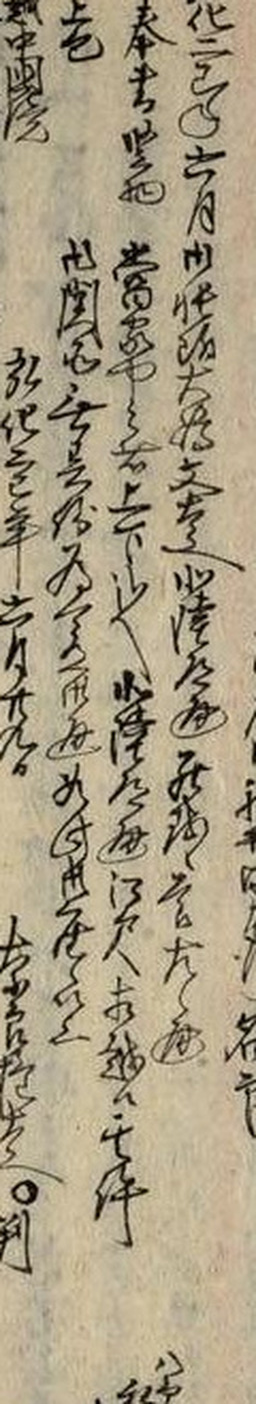奉書竪物当家中之者上下弐人北陸道通江戸へ相越候其許
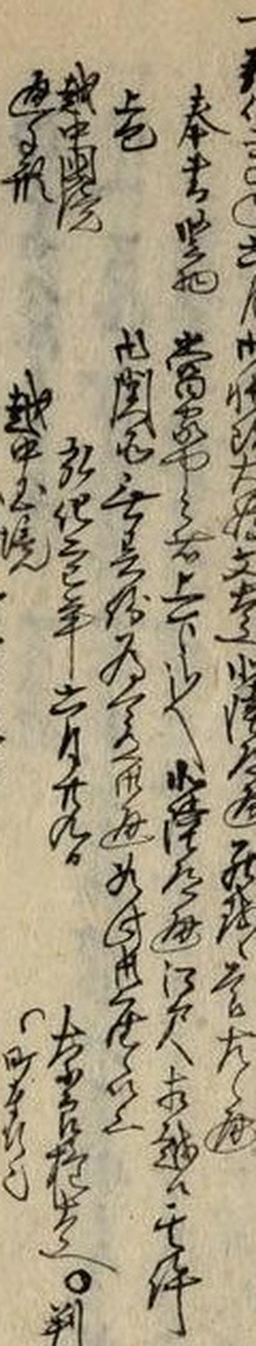御関所無異議為可有御通如此御座候以上
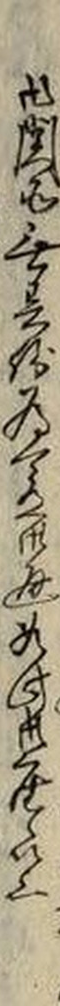御関所無異議為可有御通如此御座候以上
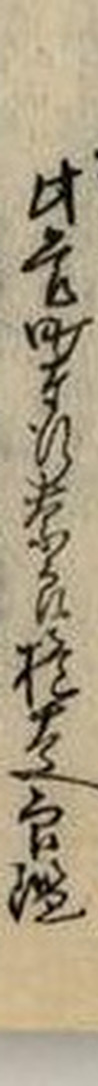此節町奉行奈良権太夫印鑑
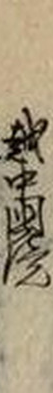越中国境
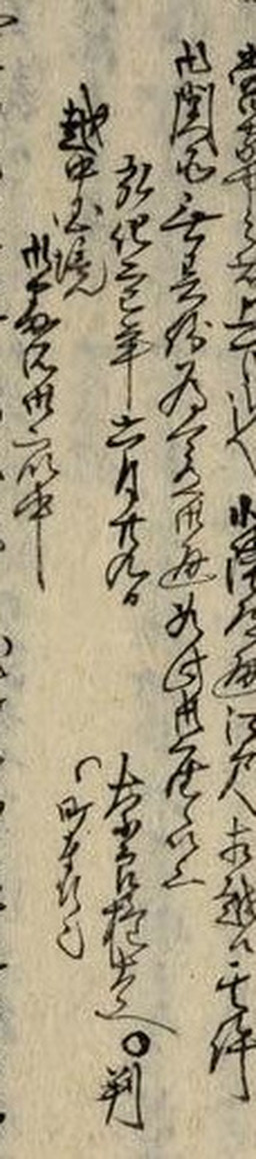弘化二巳年六月廿九日奈良権太夫〇判
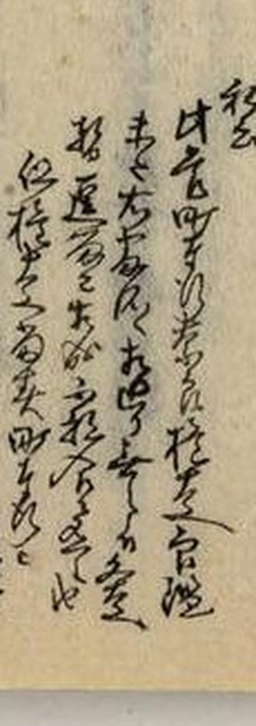未た右番所へ相廻り無之候ニ付文太夫
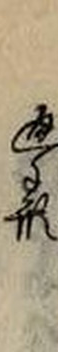通手形
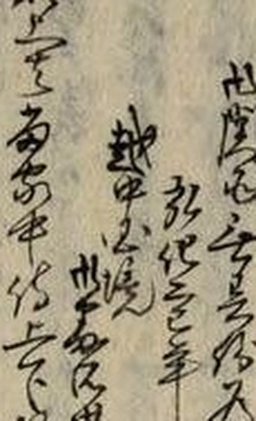越中国境
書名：御国他国諸事之部
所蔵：福井県文書館 Fukui Prefectural Archives
